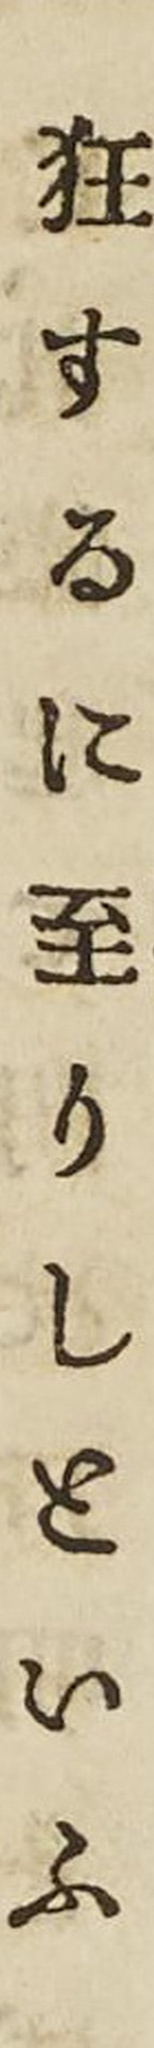狂するに至りしといふ
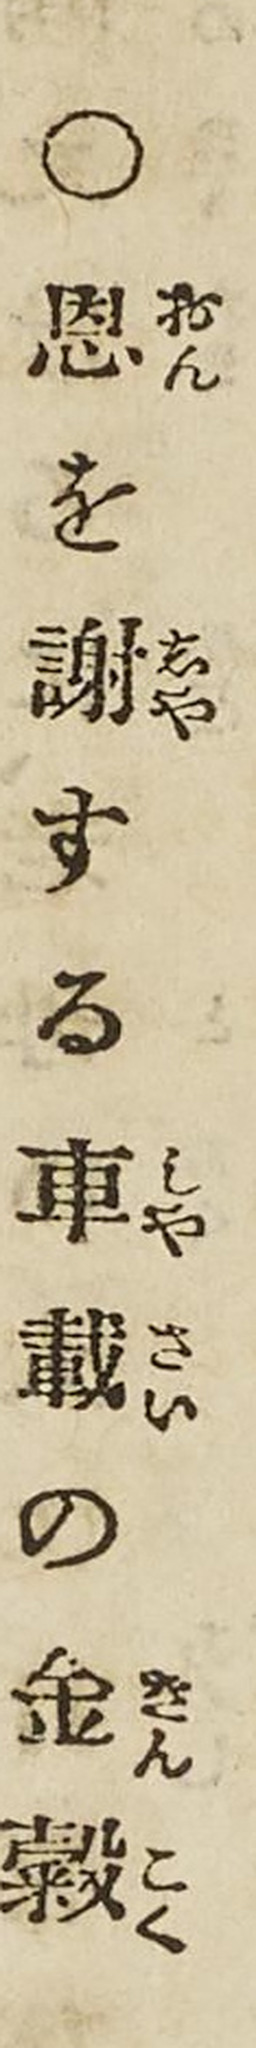○恩を謝する車載の金穀
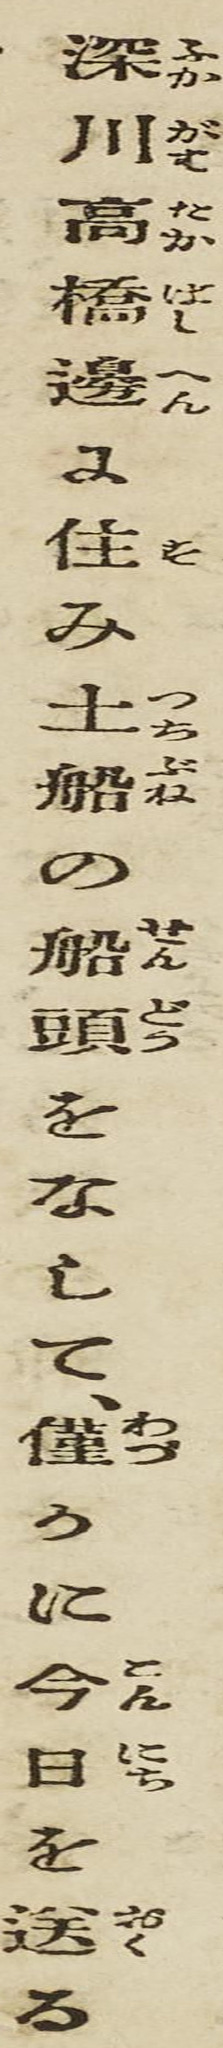深川高橋辺に住み土船の船頭をなして、僅かに今日を送る
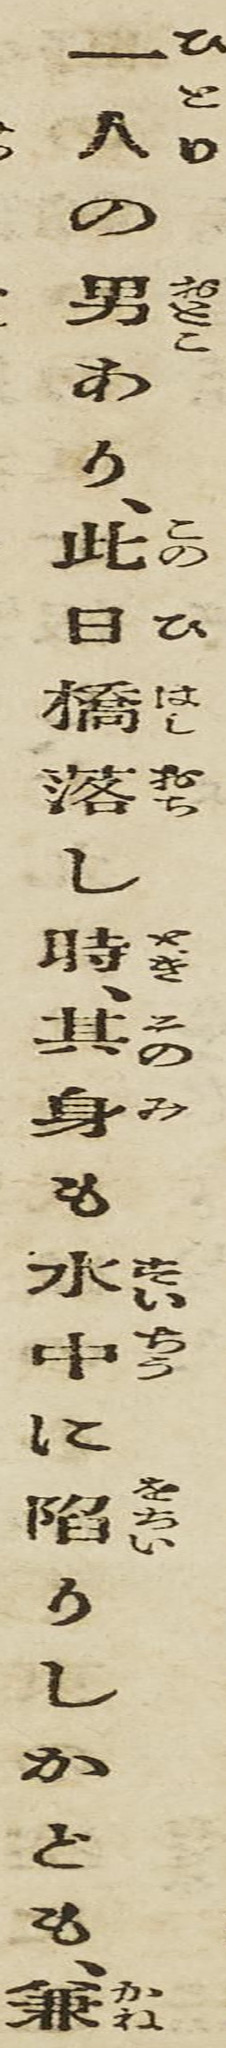一人の男あり、此日橋落し時、其身も水中に陥りしかとも、兼
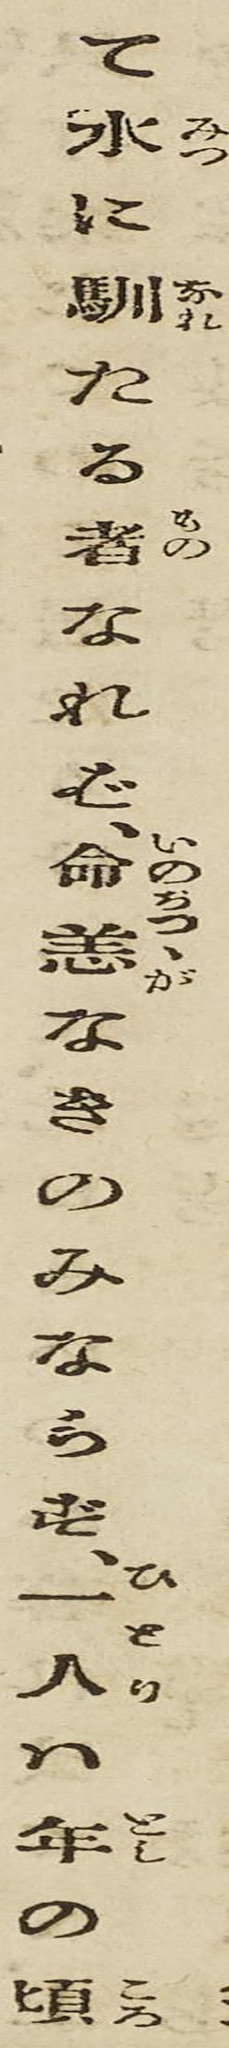て水に馴たる者なれば、命恙なきのみならず、一人は年の頃
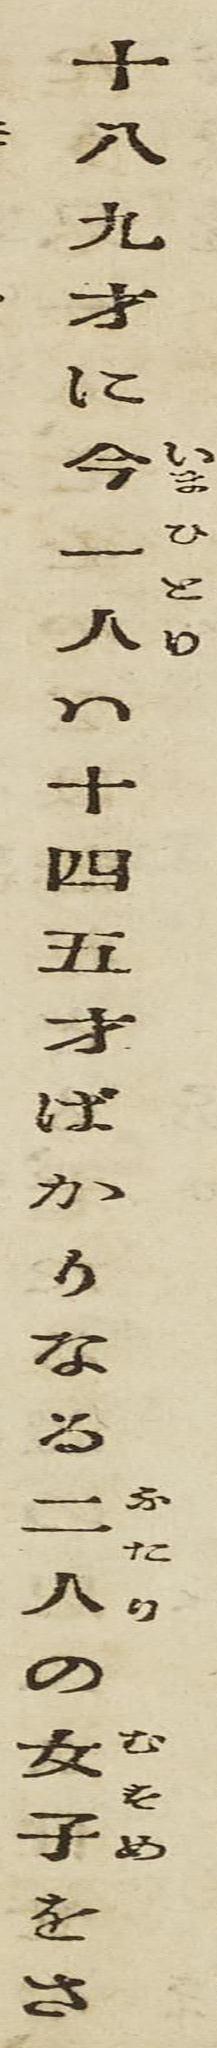十八九才に今一人は十四五才ばかりなる二人の女子をさ
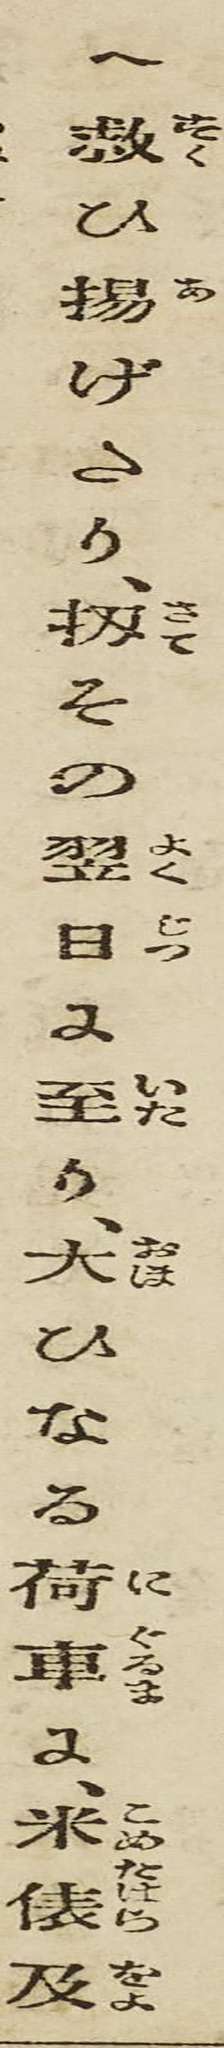へ救ひ揚げたり、扨その翌日に至り、大ひなる荷車に、米俵及
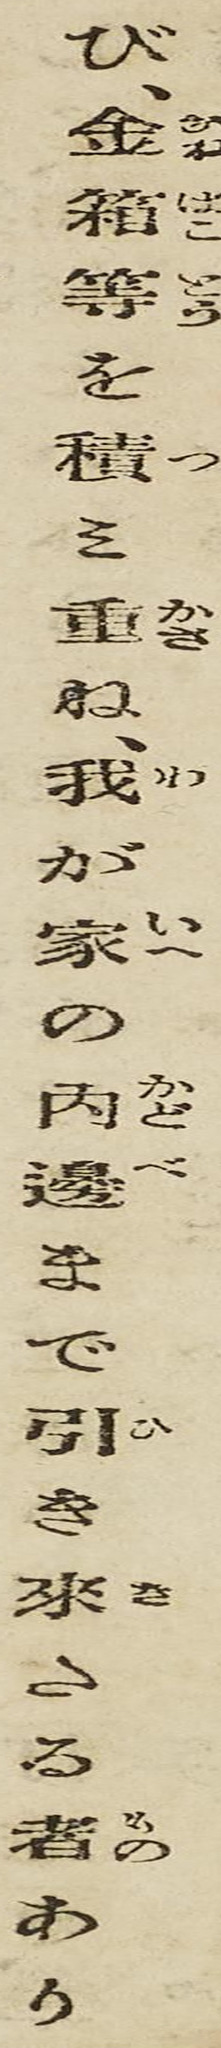び、金箱等を積み重ね、我が家の内辺まで引き来たる者あり
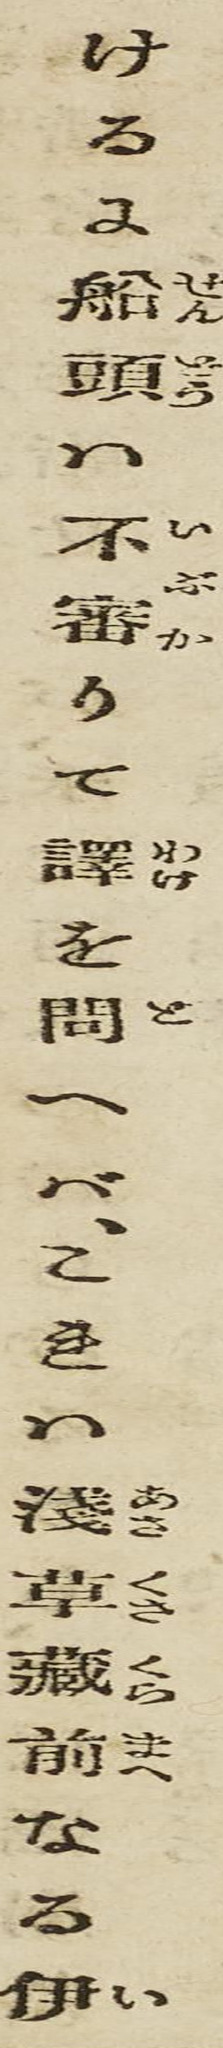けるに船頭は不審りて訳を問へば、これは浅草蔵前なる伊
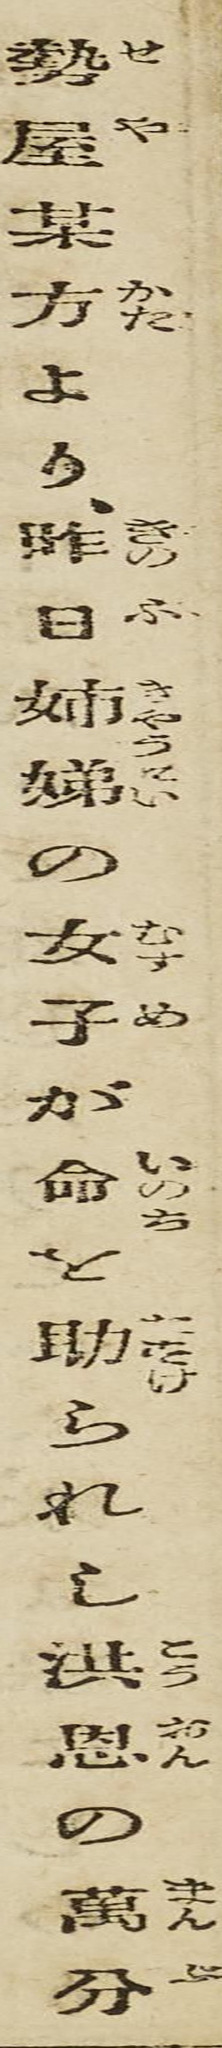勢屋某方より、昨日姉娣の女子が命を助られし洪恩の万分
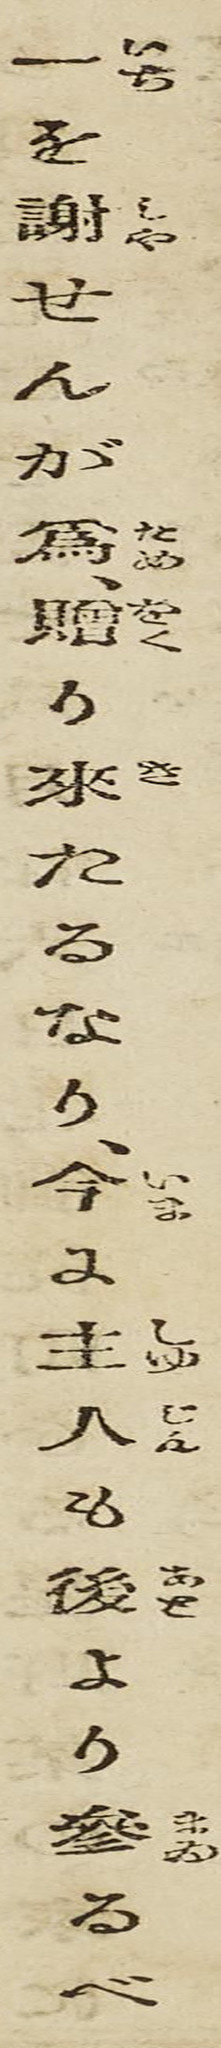一を謝せんが為、贈り来たるなり、今に主人も後より参るべ
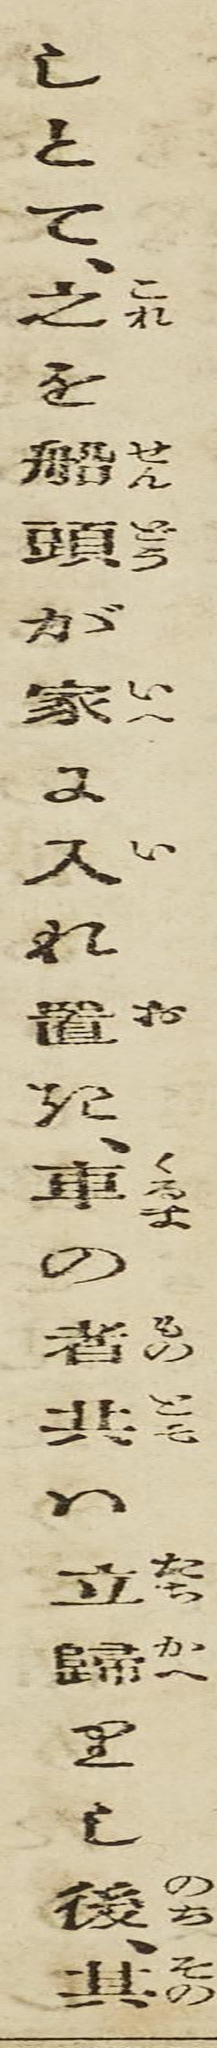しとて、之を船頭が家に入れ置き、車の者共は立帰りし後、其
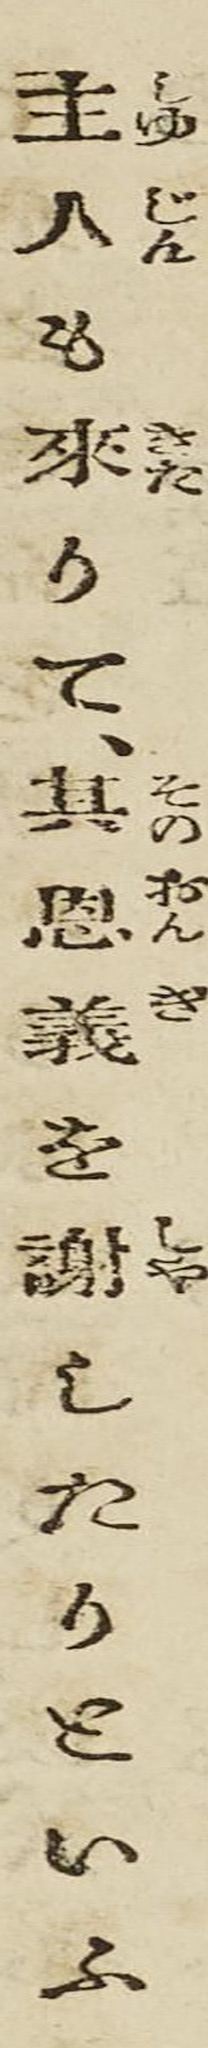主人も来たりて、其恩義を謝したりといふ
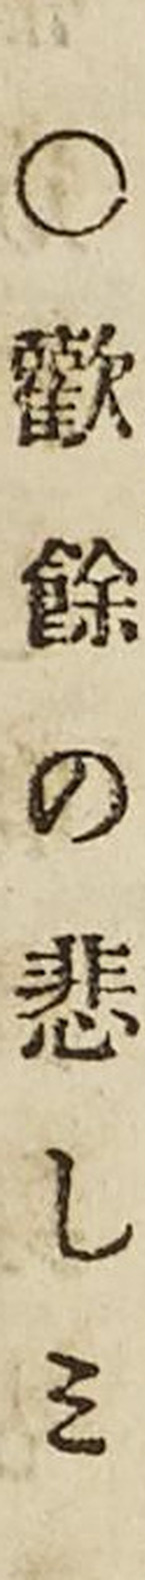○歓余の悲しみ
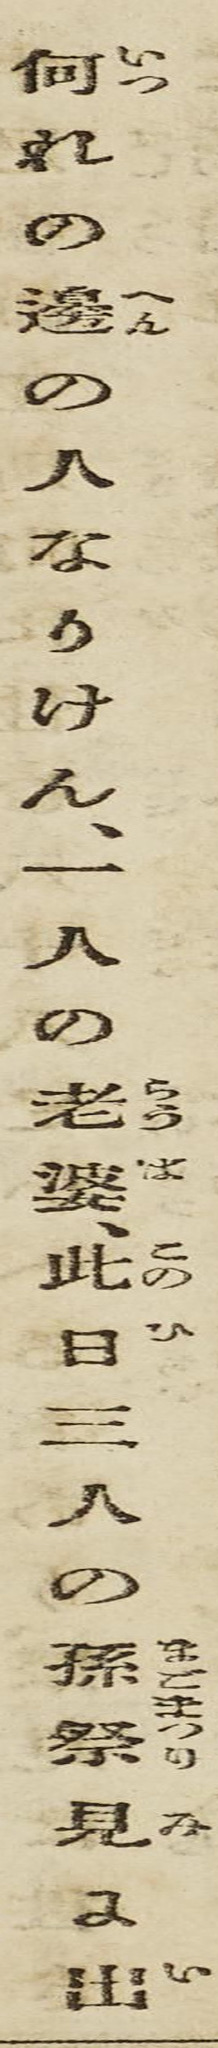何れの辺の人なりけん、一人の老婆、此日三人の孫祭見に出
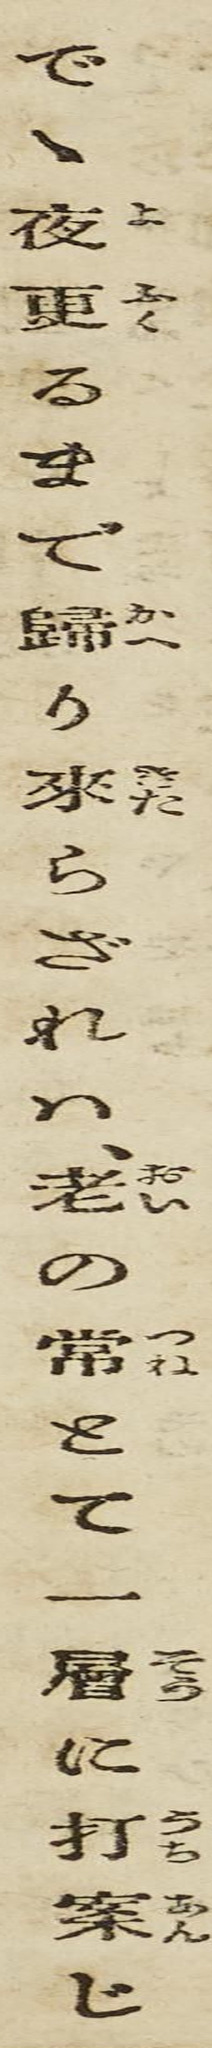でゝ夜更るまで帰り来らざれは、老の常とて一層に打案じ
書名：永代惨話　文化の夢　全
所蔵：東京大学地震研究所図書室 Earthquake Research Institute Library, The University of Tokyo, JAPAN
